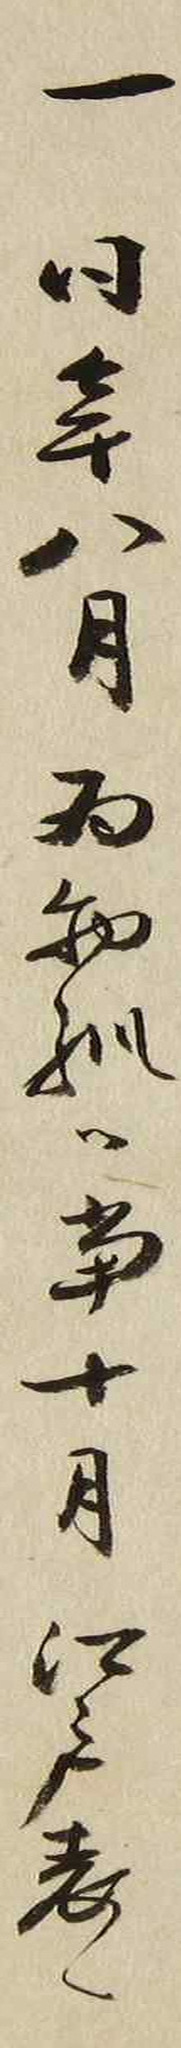一同年八月為物馴候当十月江戸表へ
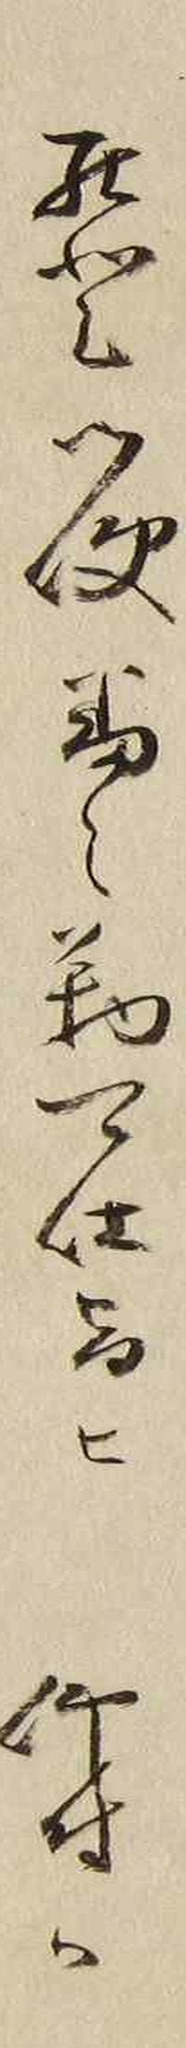罷登御使番之勤可仕旨被仰付候
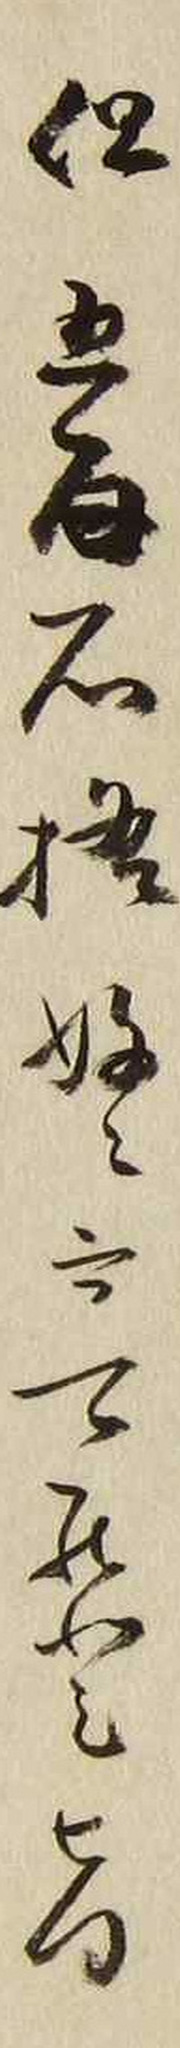但五百石格好に而可罷登旨

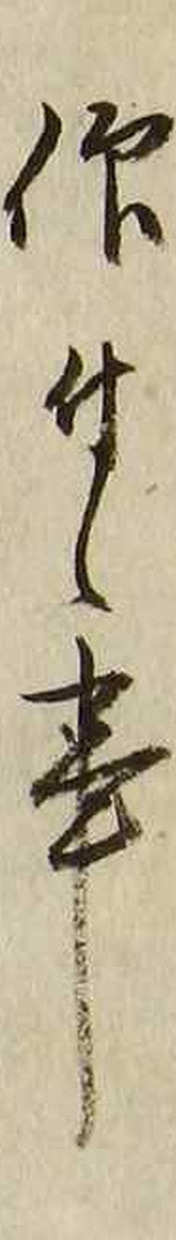仰付候事
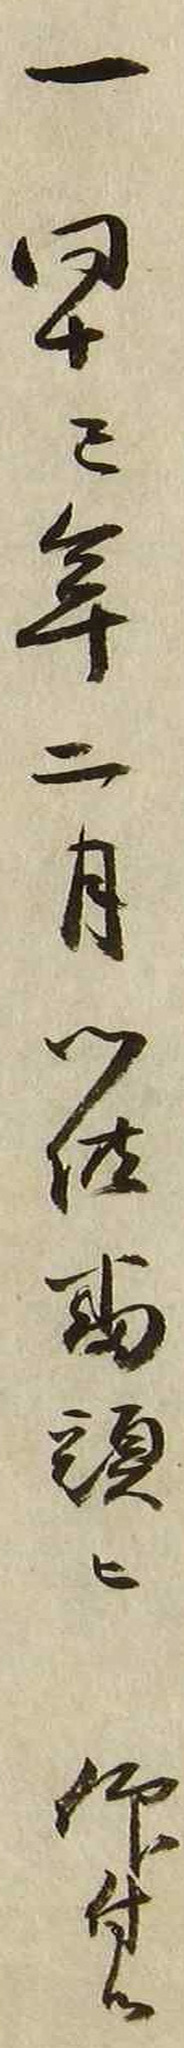一同十巳年二月御供番頭被仰付候
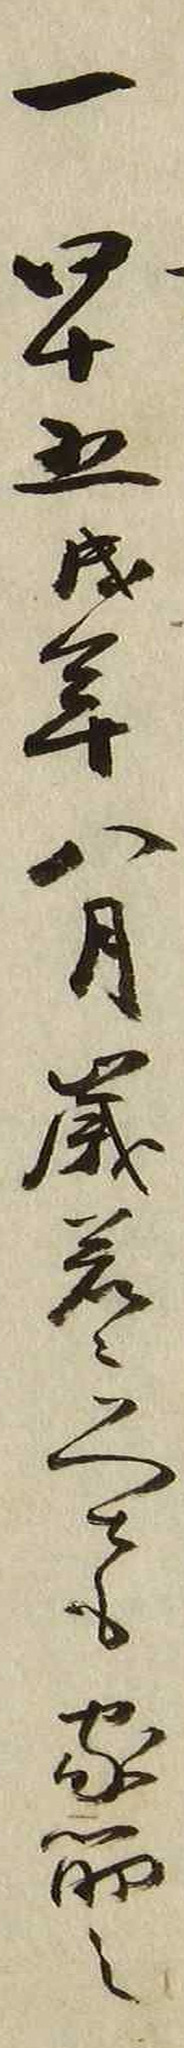一同十五戌年八月歳若に候へとも家筋之
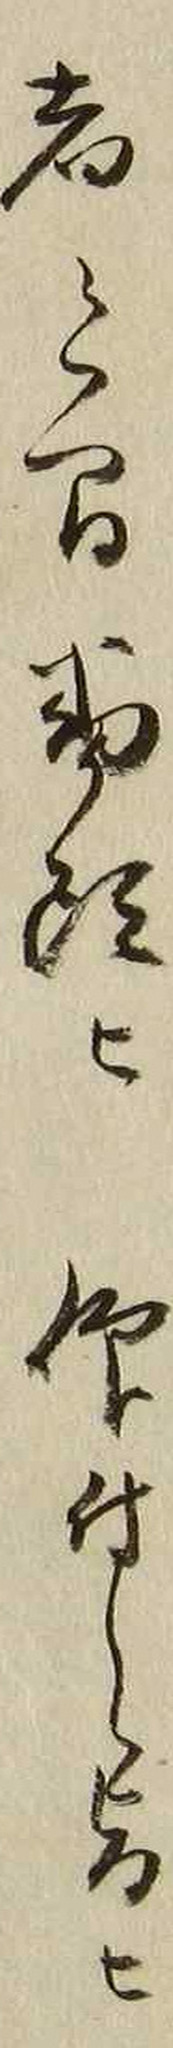者に候間番頭被仰付之旨被
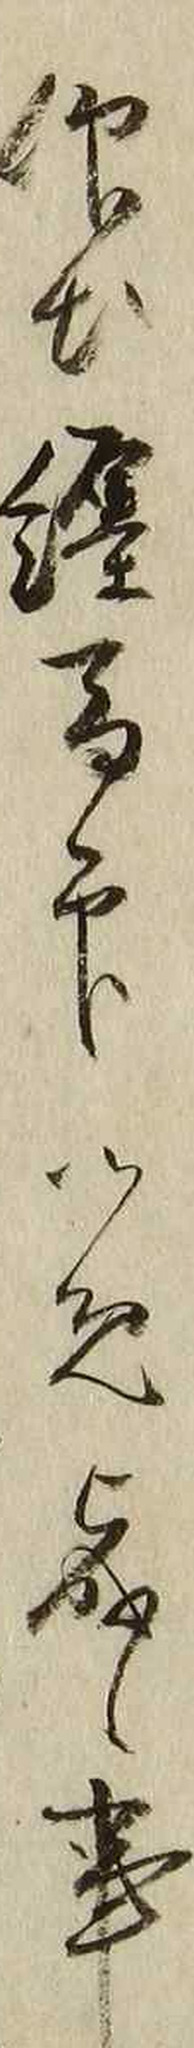仰出纏馬印御免被成候事
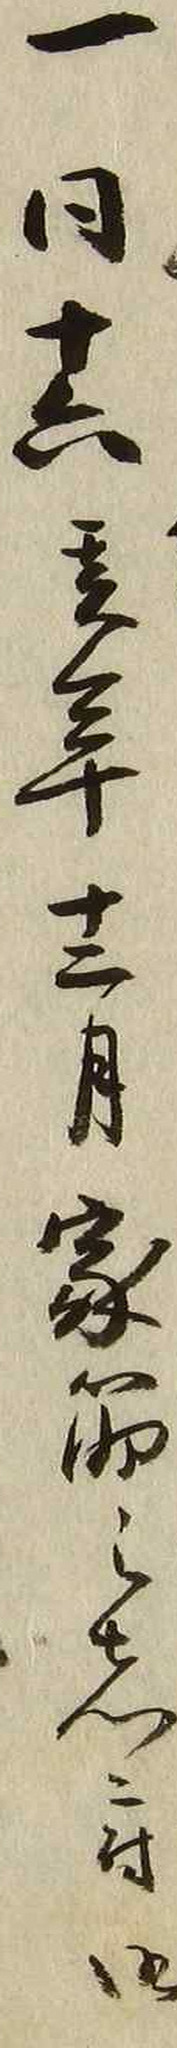一同十六亥年十二月家筋之者付御
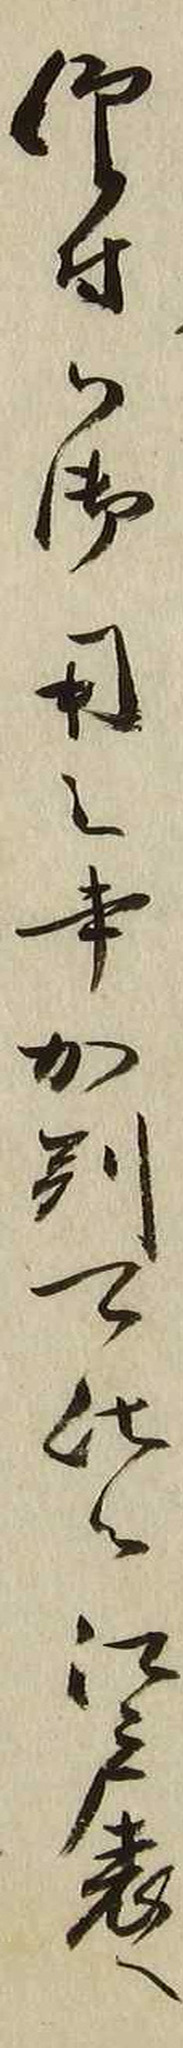仰付候御用之事加判可候仕江戸表へ
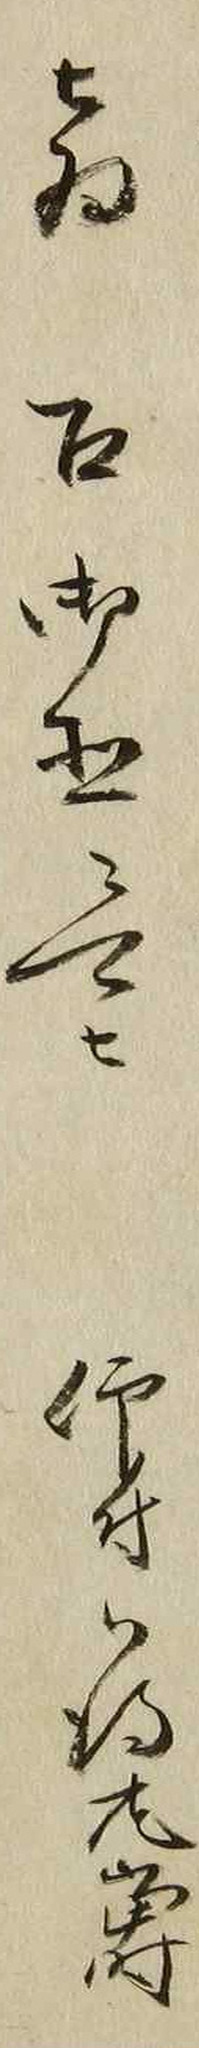被為召御直々に可被仰付候得共当時
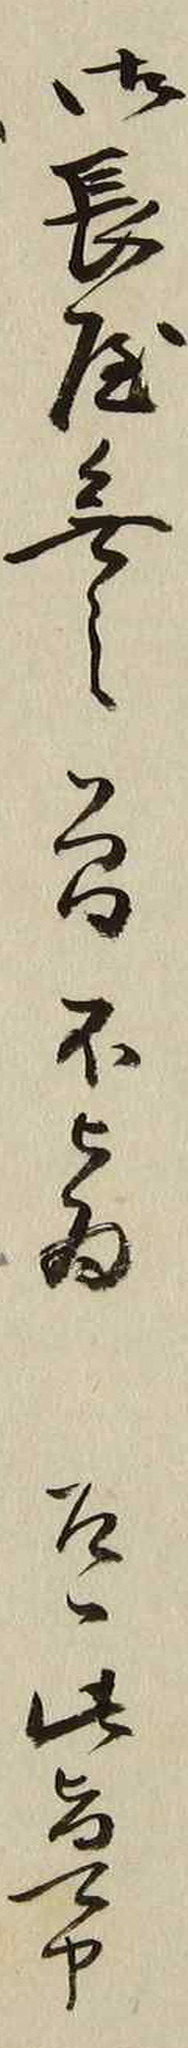御長屋無之候間不被為召候此旨可申
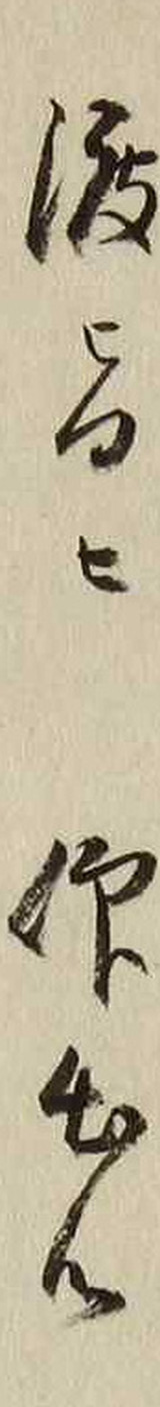渡旨被仰出候
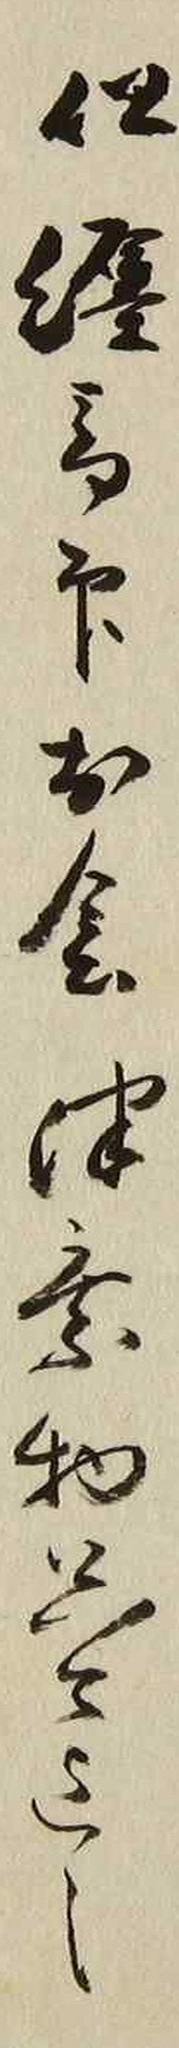但纏馬印於会津乗物只今迄之
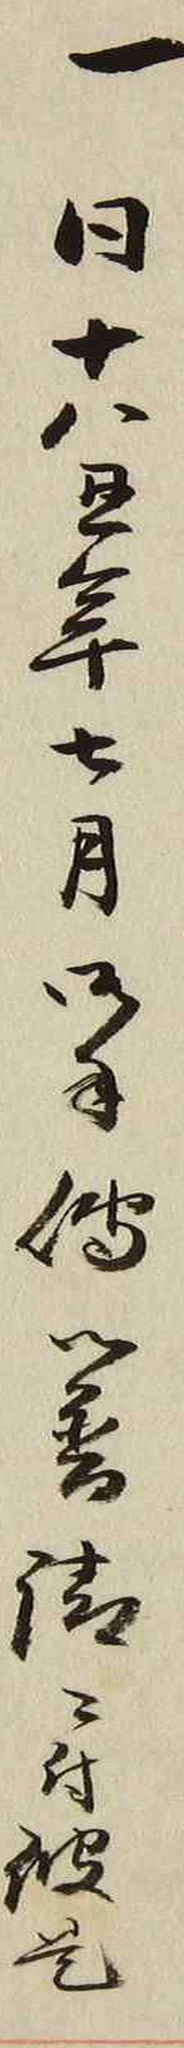一同十八丑年七月御手伝御普請に付彼是
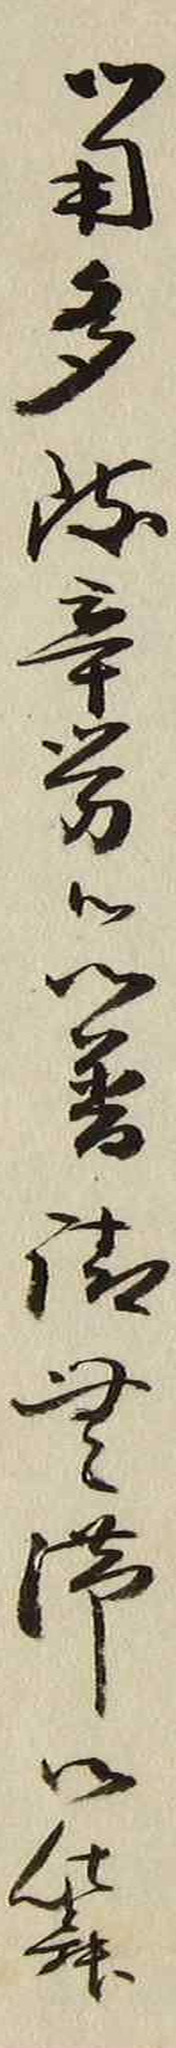御用多致辛労候御普請無滞御仕舞
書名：諸士系譜　巻之292　き之部1
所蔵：会津若松市立会津図書館
